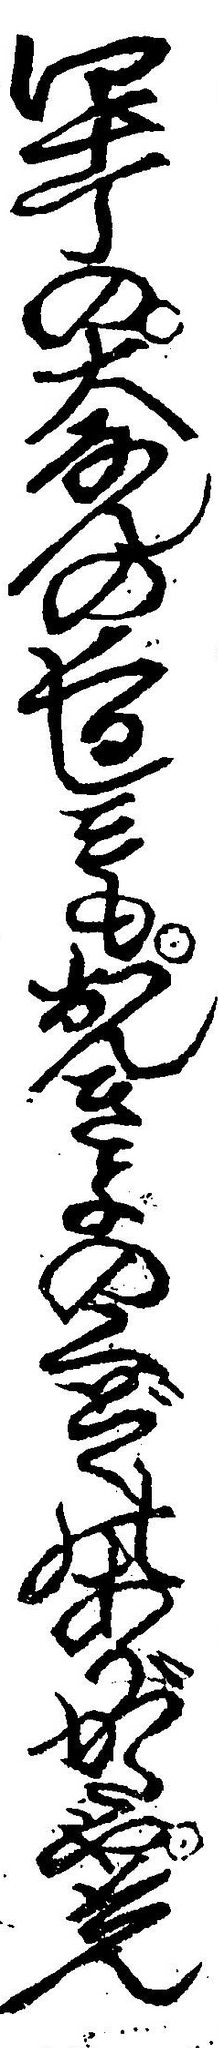四十丁の。大なんのくるしみも。おんきよのくどくのありがたや。そん
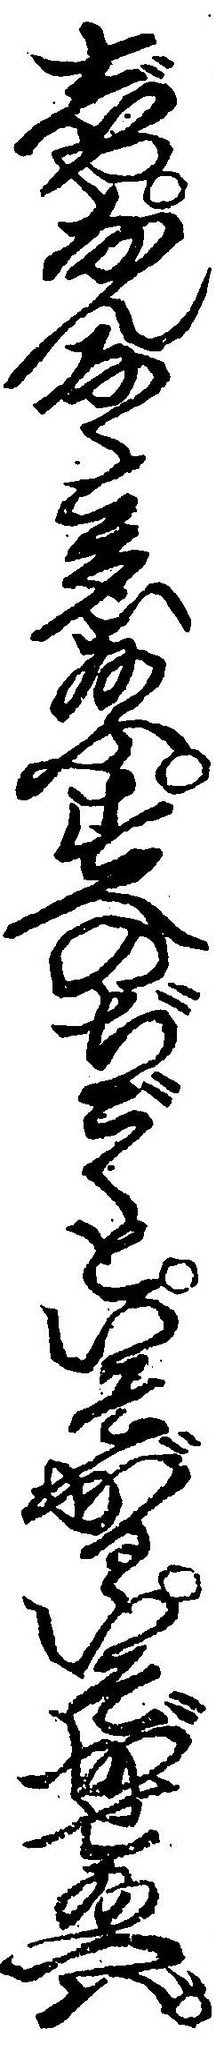じや。なんなくこゑ給ふ。すへのぢごくと。いそがるゝ。いそがせ給へば。
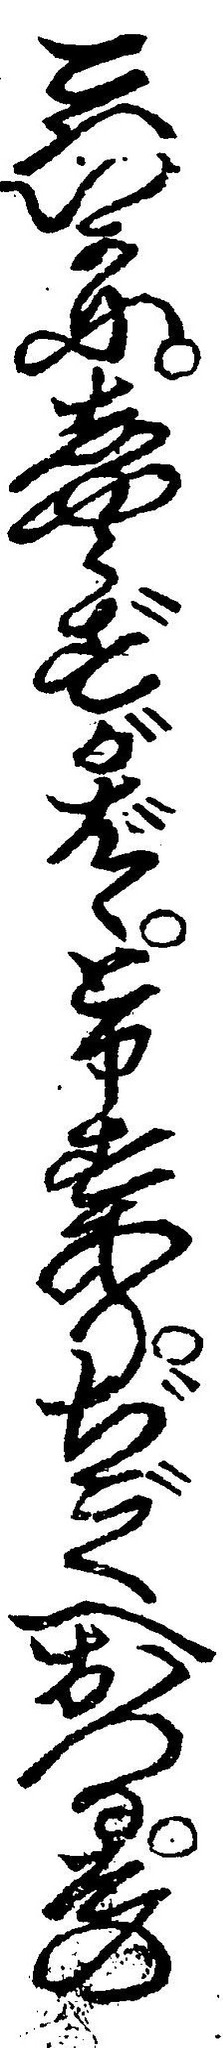こはいかに。しやうずがばゝ。と申すあり。ぢごくへおつる。その
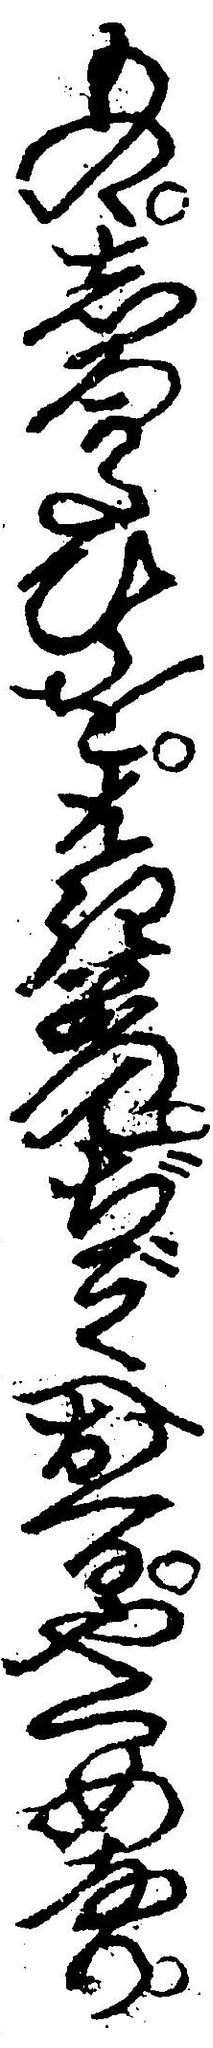ものゝ。しろかたひらを。はきとつて。ぢごくへおくる。やくめなり。

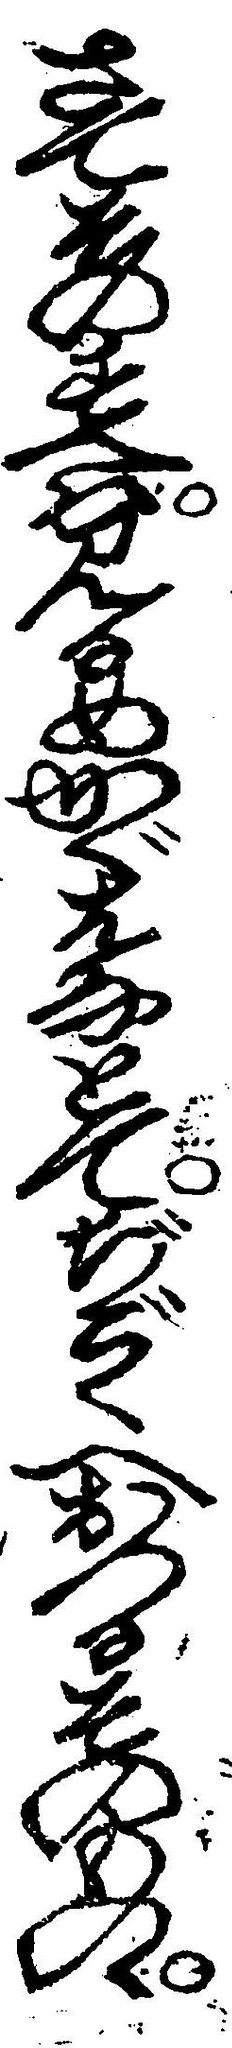さてそのすへは。見るめかぐはなとて。ぢごくへおつるそのものゝ。
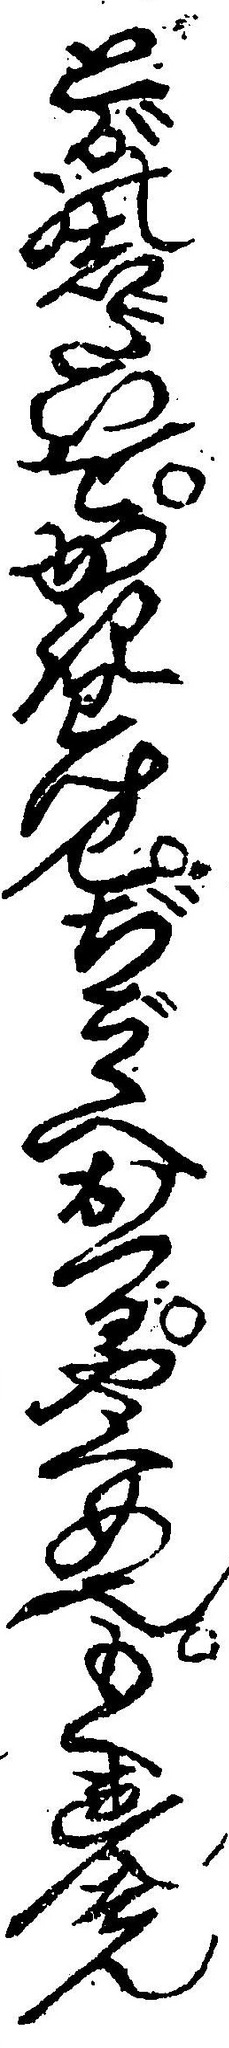とがのしだいを。かきわけて。ぢごくへおつる。やくめ也。もくれんそん
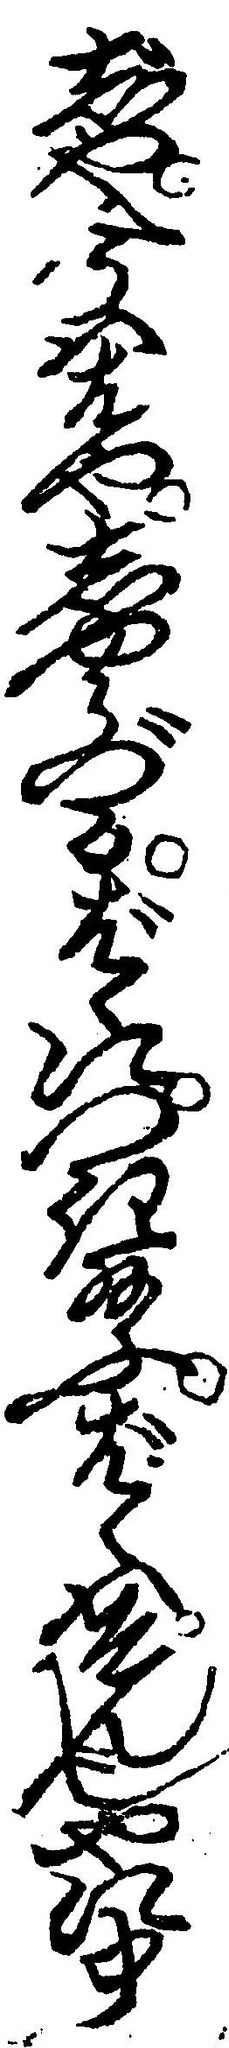じや。今ははや。しやうづか。ばゞに。つき給ふ。ばゞはそんじやに申
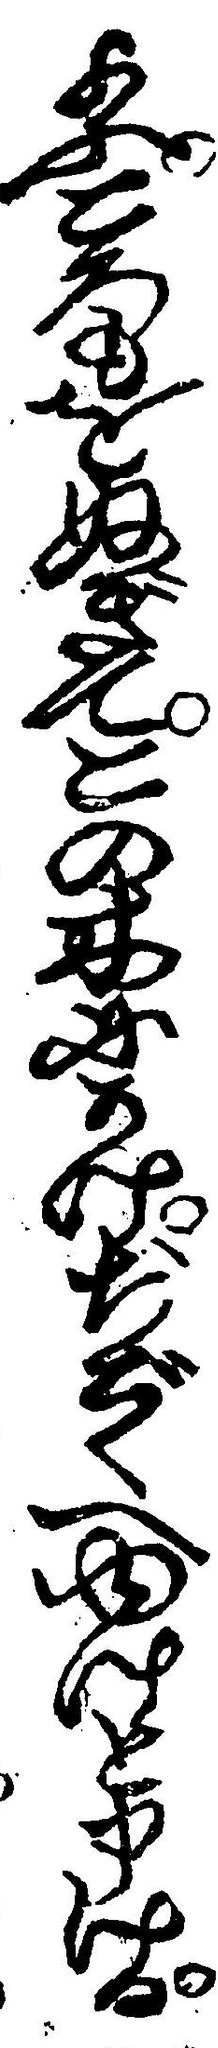よふ。ころもをぬぎて。この木にかけ。ぢごくへゆけと申ける。
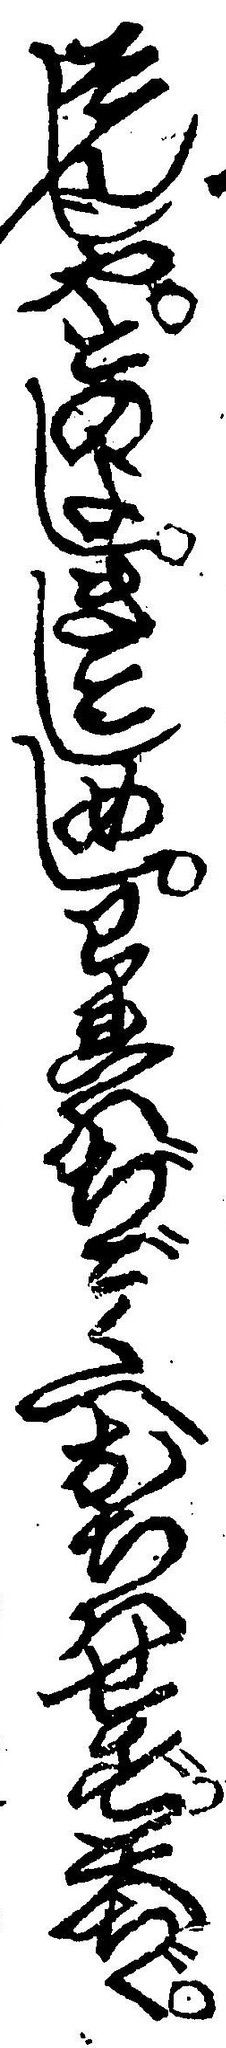そんじや。このよし。きこしめし。われはぢごくへおちはせず。天ぢく。
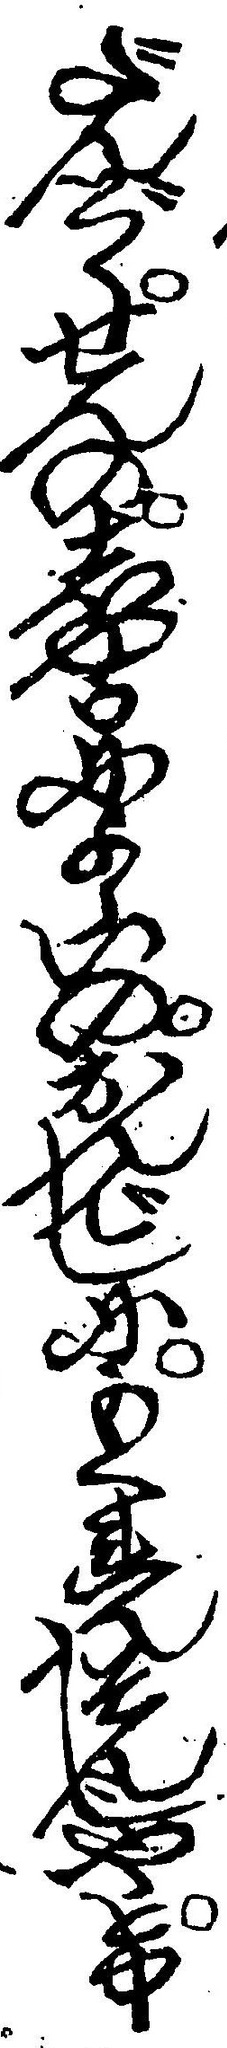だんどく。せんの。しやかによらいの。おんでしに。もくれんそんじやと。申
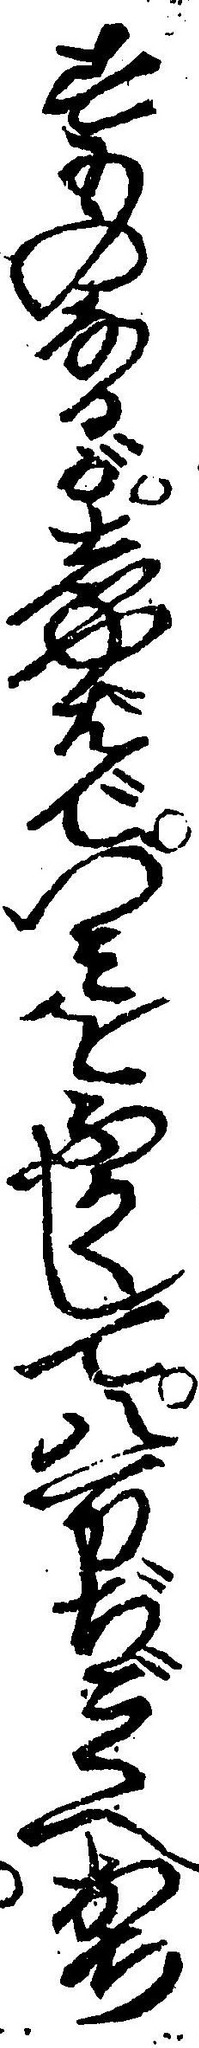そのものなるが。しやばで。つみをふかくして。八万ぢごくへおち
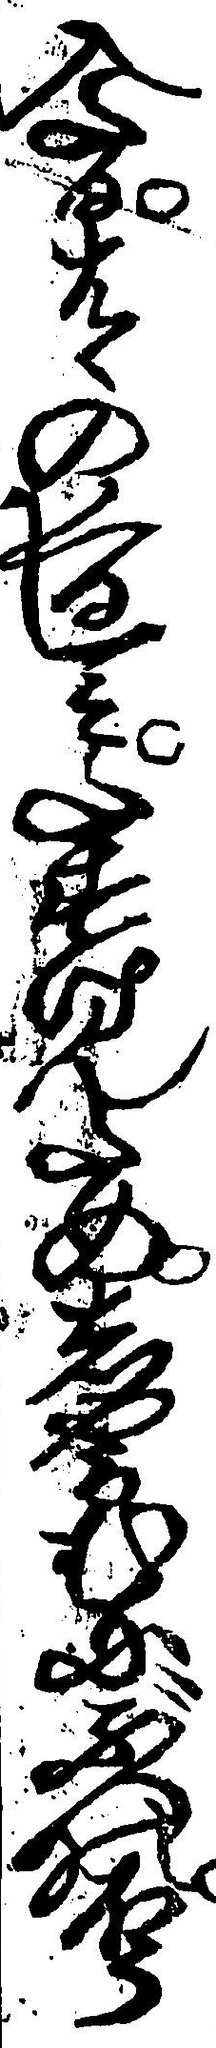入たる。はゝのくるしみ。たすけんため。しやかむにぶつの。ほう
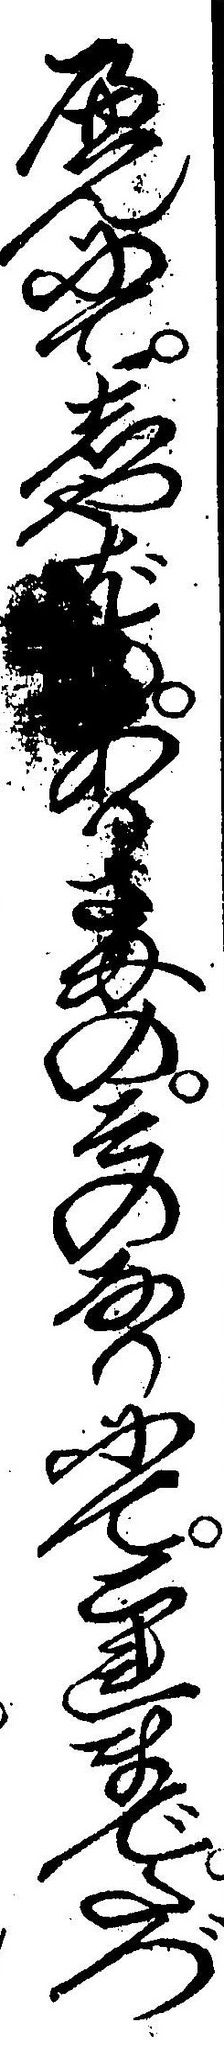へんにて。しやば。ありさまの。そのなりにて。これまで。たづ
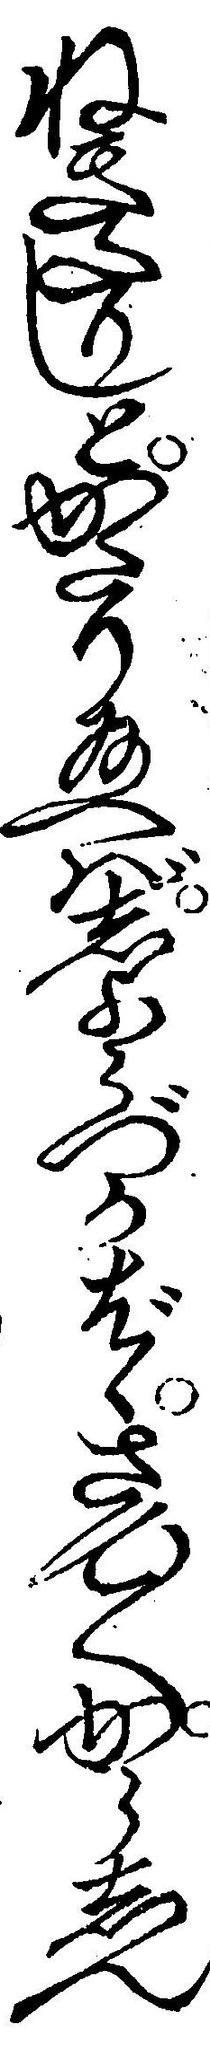ねきたりしと。かたり給へば。しようづかばゞ。さて〳〵。かうしん
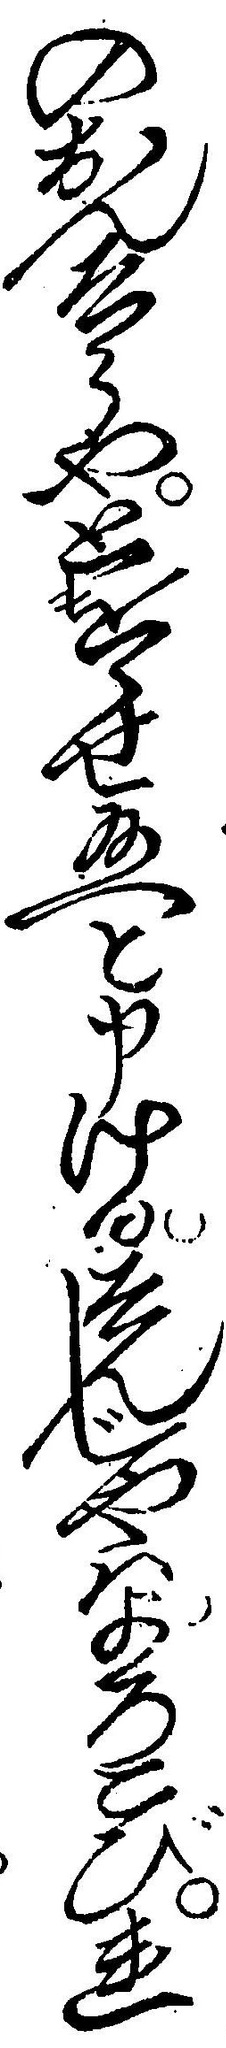のおんそうや。とをらせ給へと申ける。そんじやは。よろこび。れ
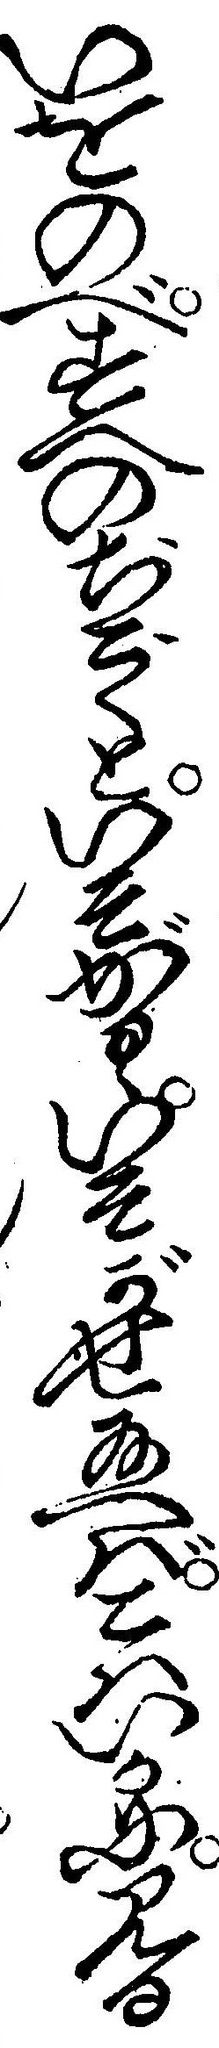いをのべ。すへのぢごくと。いそがるゝ。いそがせ給へば。こはいかに。見るめ
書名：目連尊者地獄めくり / 宇留藤太夫正本
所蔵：東京大学総合図書館 General Library in the University of Tokyo, JAPAN
